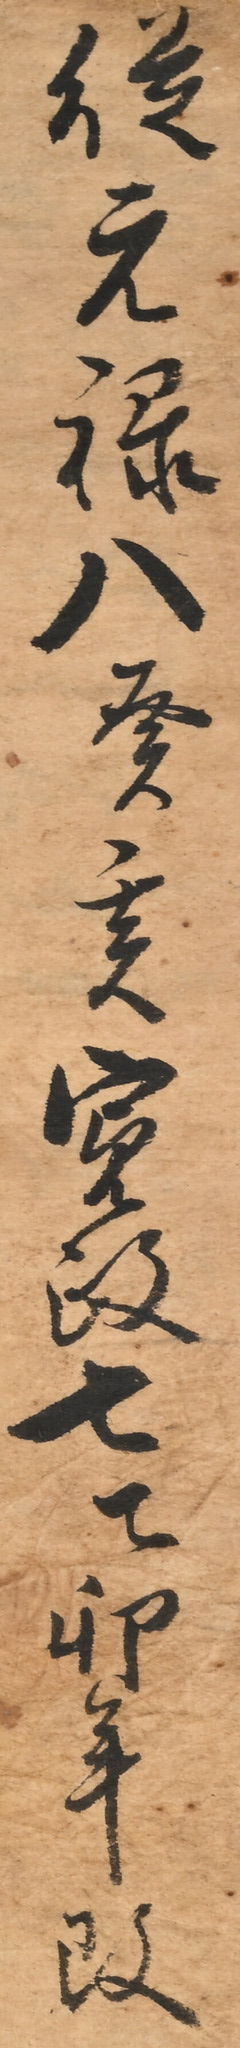従元禄八癸亥寛政七乙卯年改
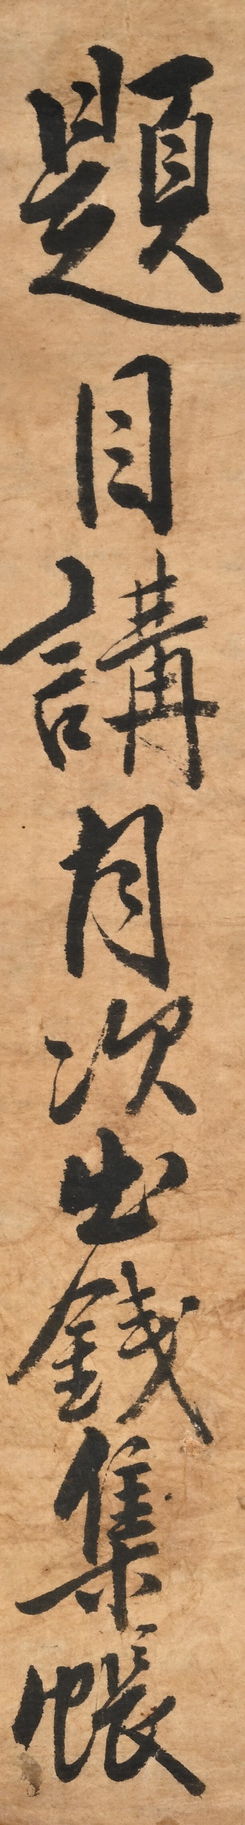題目講月次出銭集帳
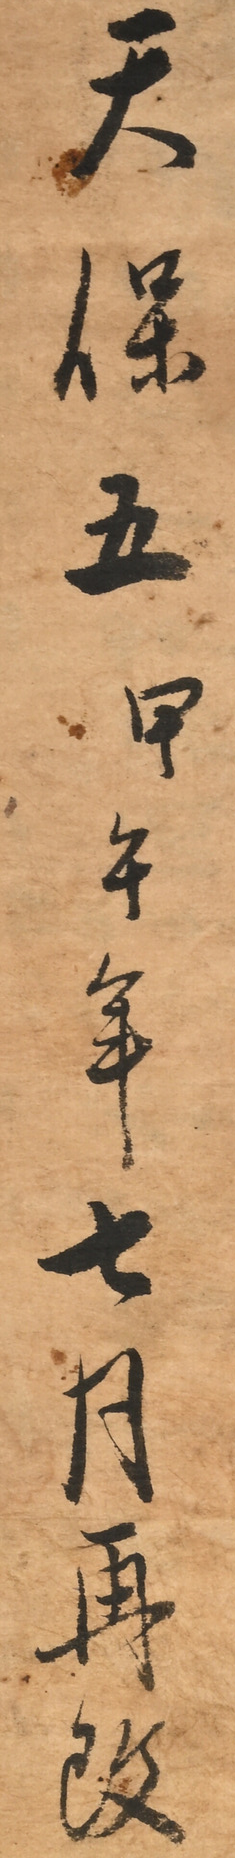天保五甲午年七月再改
